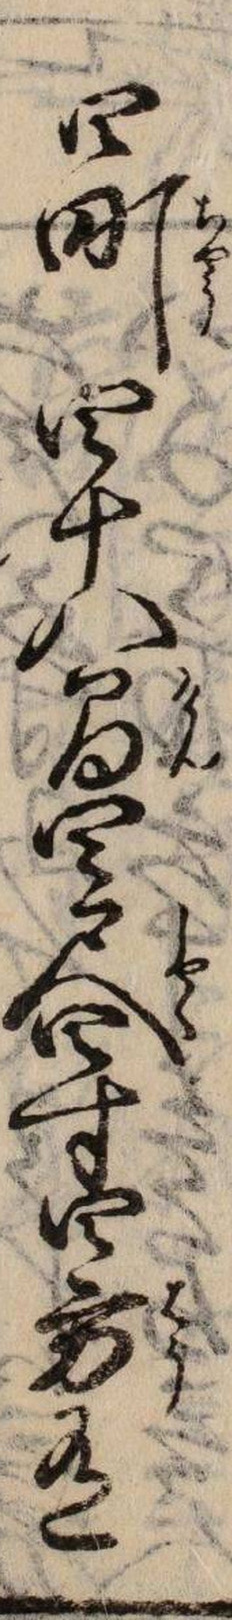四町四千八間四尺四寸四方有
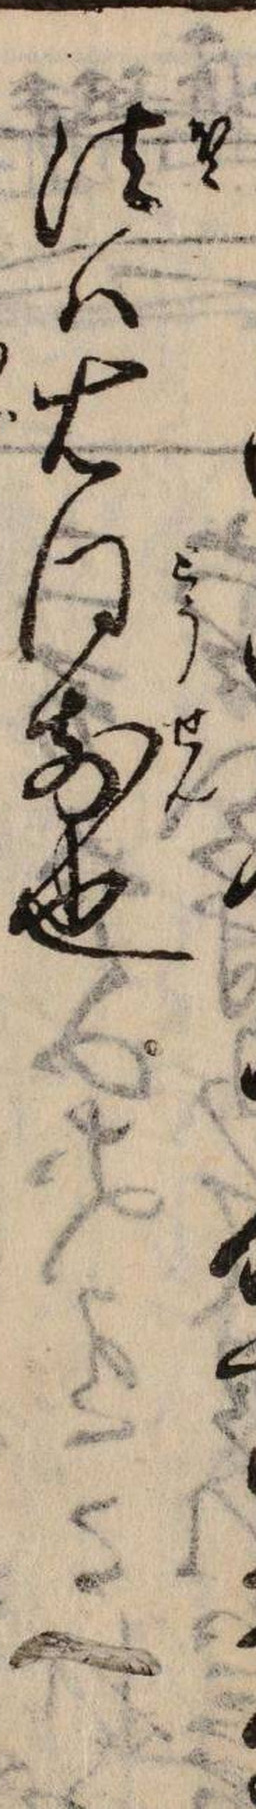法は右同前也
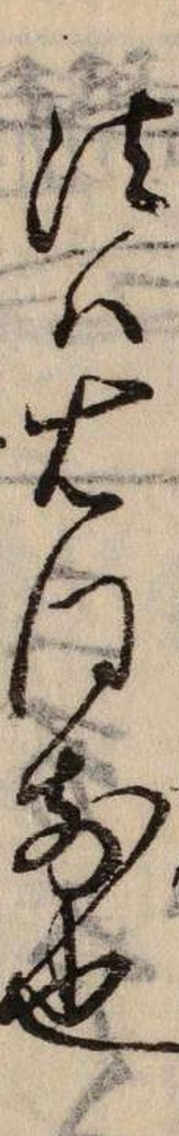法は右同前也
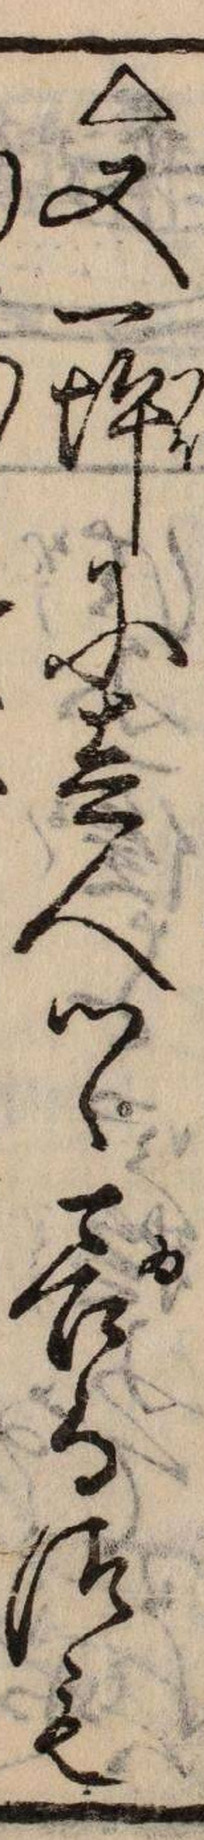△又一坪に壱人つつ居るつも
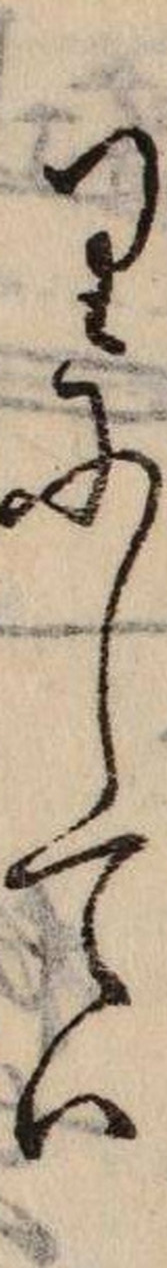りにしては
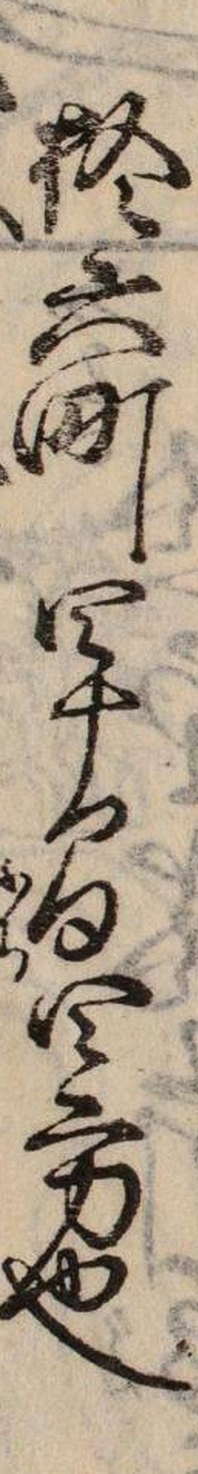拾六町四千間四方也
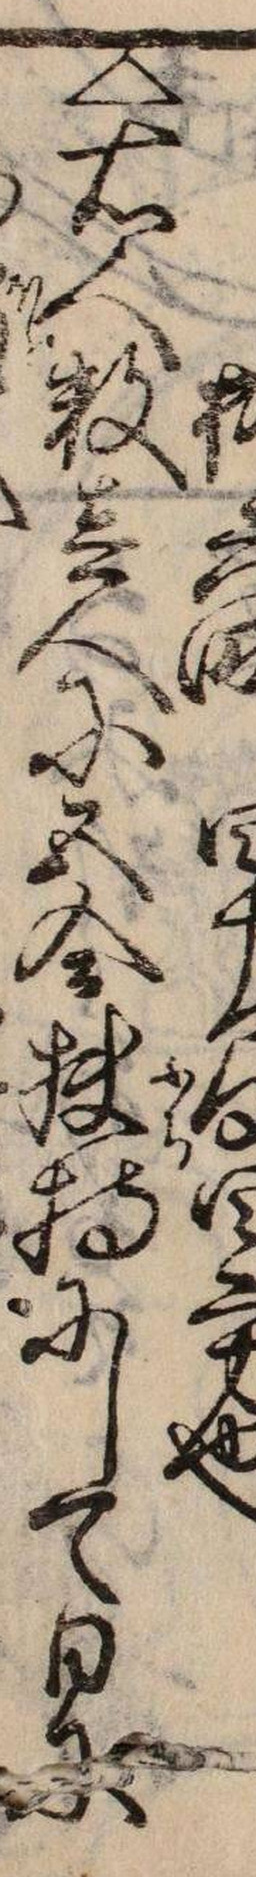△右人数壱人に五合扶持にして日に
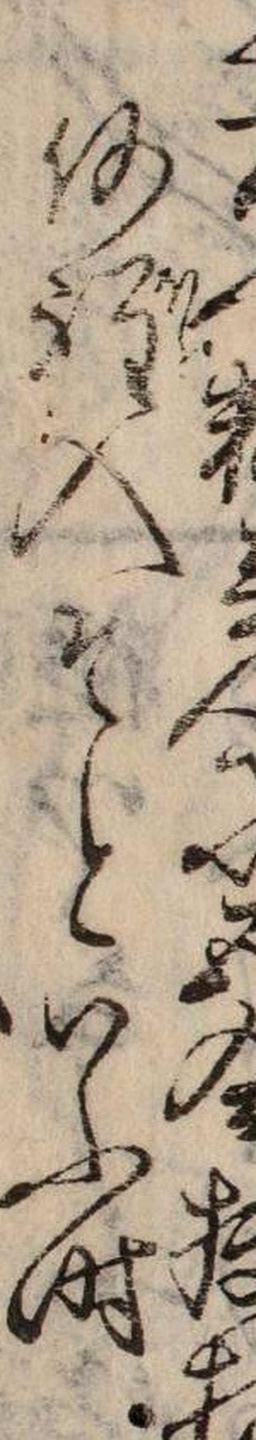何程入そといふ時
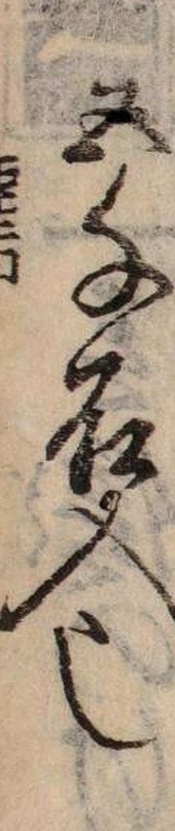五千石入也

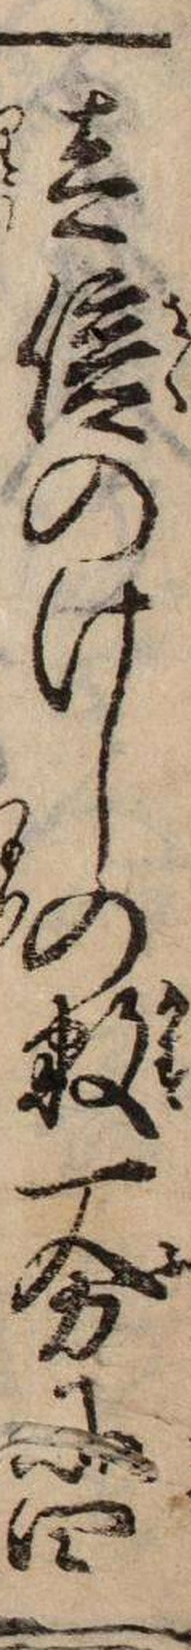壱億のけしの数一分に四
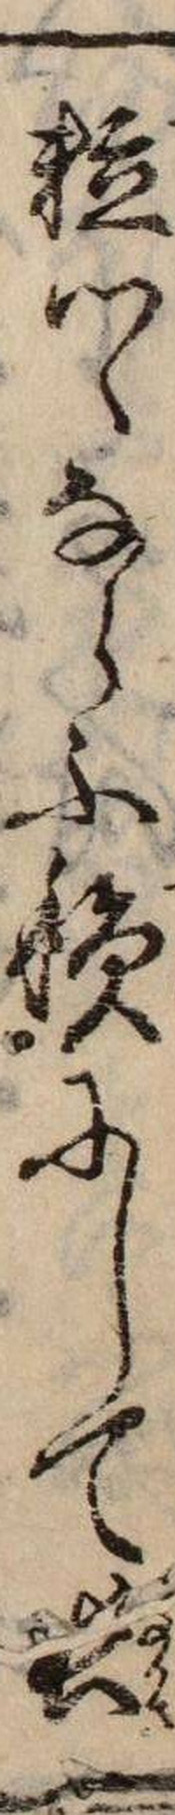粒つつならふ積にして長
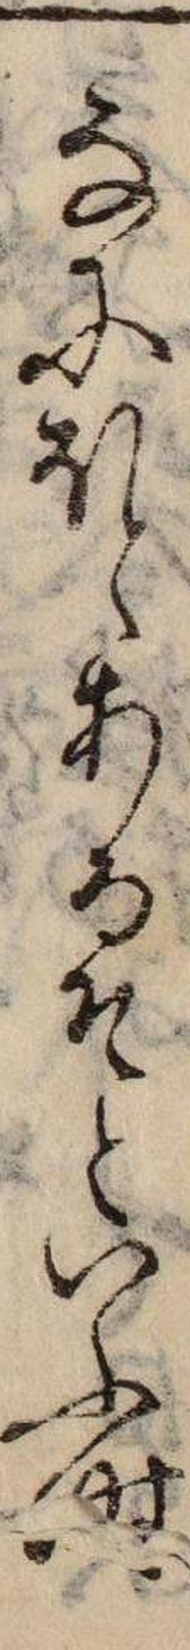なにほとあるそといふ時
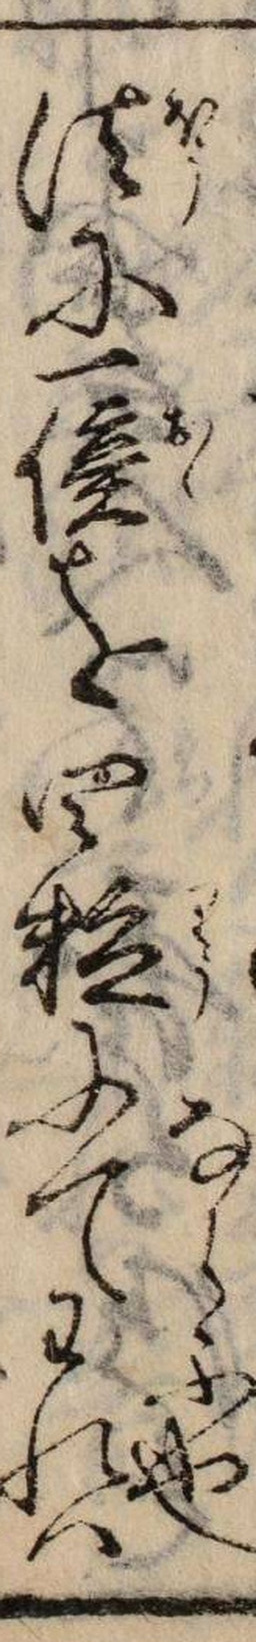法に一億を四粒にてわれは
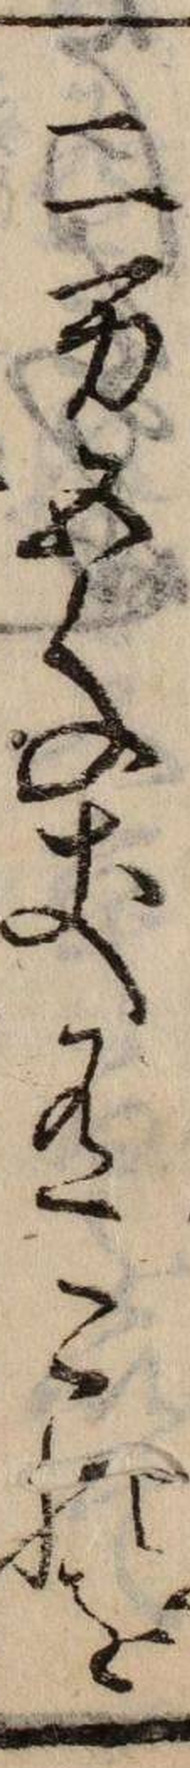二万五千丈有これを
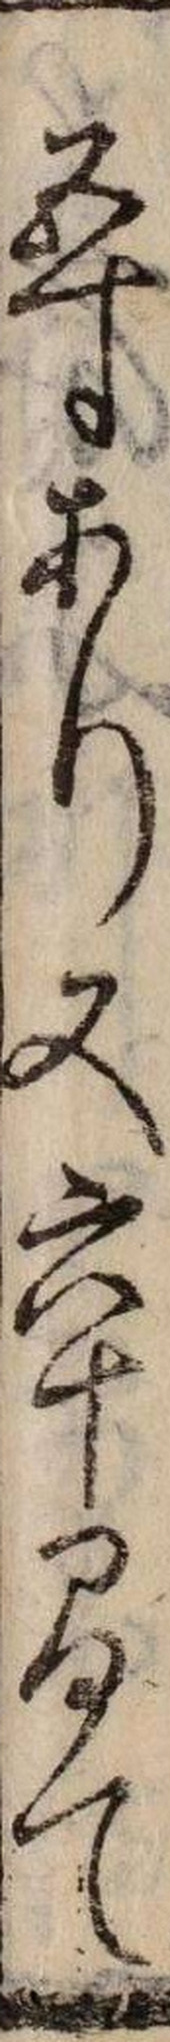五寸あり又六十間て
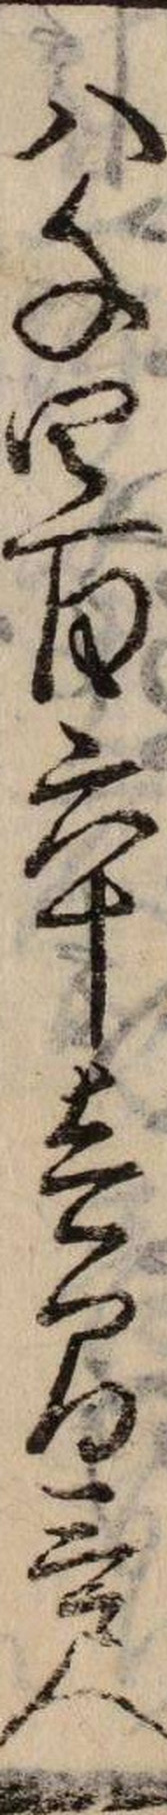八千四百六十壱間三尺
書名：塵劫記（寛永11年自跋、京都府立京都学・歴彩館追貴8）
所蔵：京都府立京都学・歴彩館 国文学研究資料館
